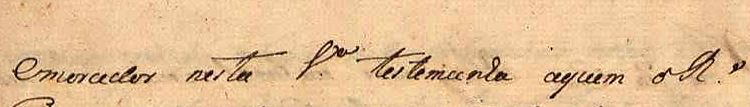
e mercedor nesta V.a testemunha a quem o R. o
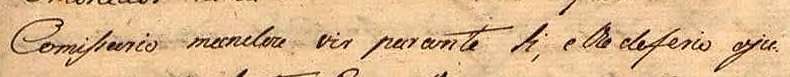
Comissario mandou vir parante si, e lhe deferio o ju
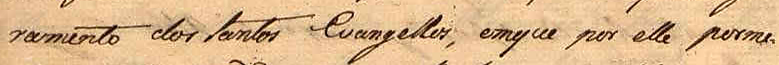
ramento dos santos Evangelhos, em que por elle porme
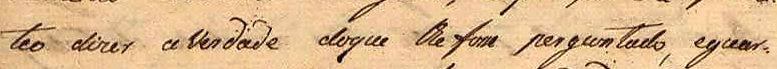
teo dizer a verdade do que lhe fosse perguntado, e guar
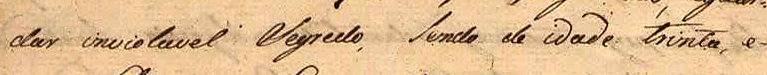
dar inviolavel Segredo, sendo de idade trinta, e
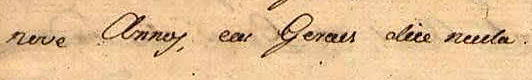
nove Annos, e as Geraes dice nada.
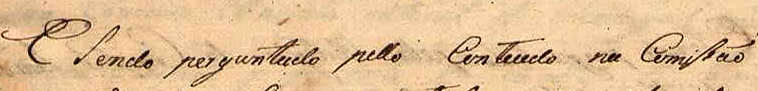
E Sendo perguntado pello Conteudo na Comissaõ
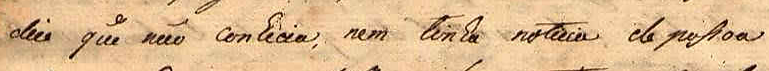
dico que naõ conhecia, nem tinha noticia de pessoa
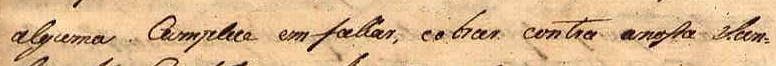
alguma Cumplece em fallar, e obrar contra a nossa San
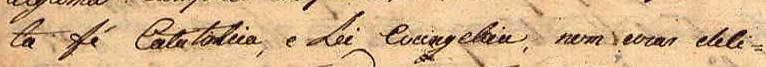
ta fé Catatolica, e Lei Evangelica, nem uzar de li
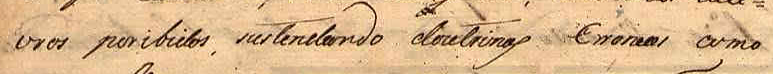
vros poribidos sustendando doutrinas Erroneas como
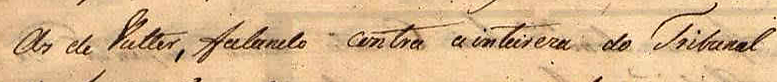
as de Vulter, falando contra a inteireza do Tribunal
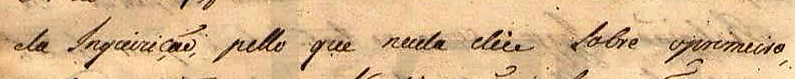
da Inquiziçaõ, pello que nada dice sobre o primeiro,
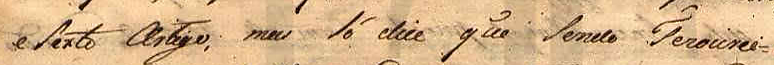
e sexto Artigo, mas só dice que sendo Tezourei
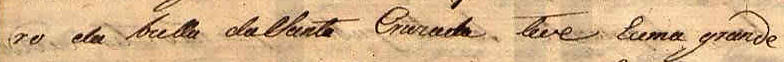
ro da Bulla da Santa Cruzada teve huma grande
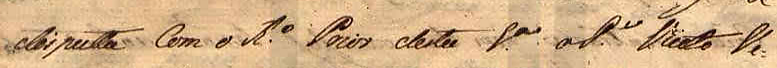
disputa Com o R.o Prior desta V.a o P.e Victo Ve
